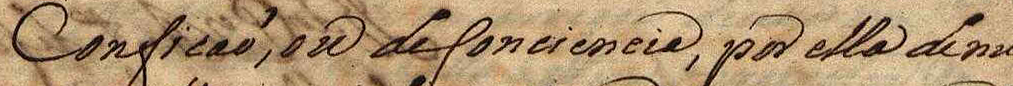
Confiçaõ, ou de Conciencia, por ella denu
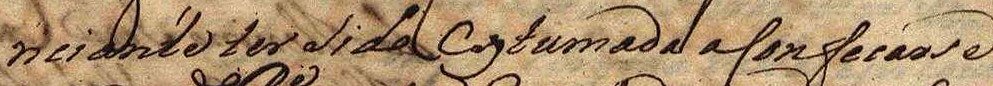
nciante ter sido costumada a Confecarse
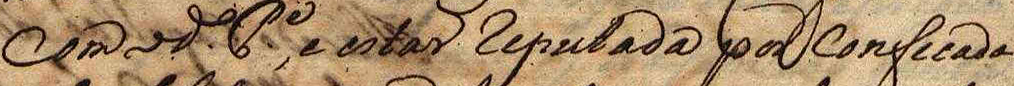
com o d.o P.e, e estar Reputada por confecada
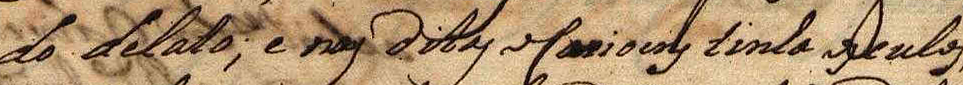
do delato, e nas ditas oCazioens tinha osculos,
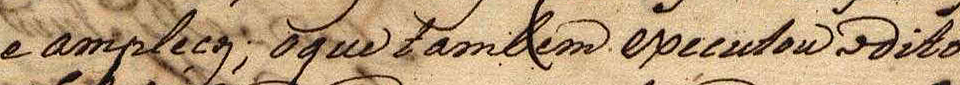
e ampleços; o que tambem executou o dito
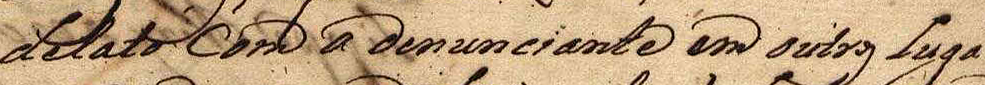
delato com a denunciante em outros luga
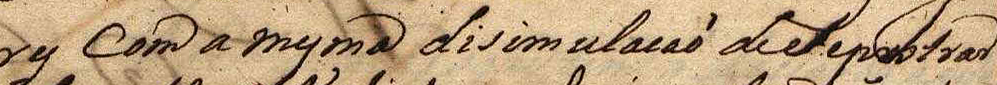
res com a mesma disimulaçaõ de se prostrar
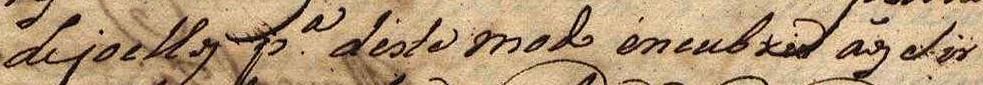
de joelhos p.a deste modo encubrir aos Sir
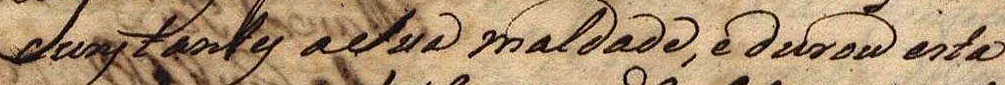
cunstantes a Sua maldade, e durou esta
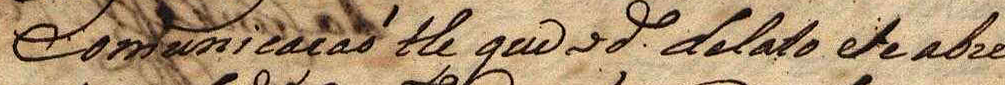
comunicaçaõ the que o d.o delato Se abze
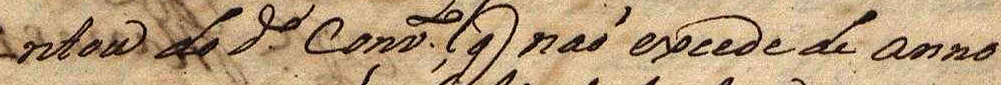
ntou do d.o Conv.to, q̄ naõ excede de anno
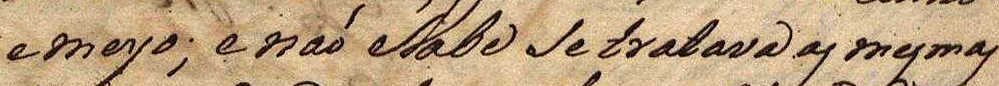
e meyo; e naõ Sabe Se tratava as mesmas
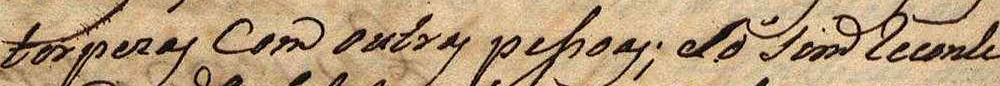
torpezas com outras pessoas; Só sim Reconhe
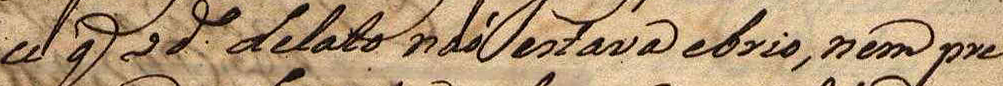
ce q̄ o d.o delato naõ estava ebrio, nem pre
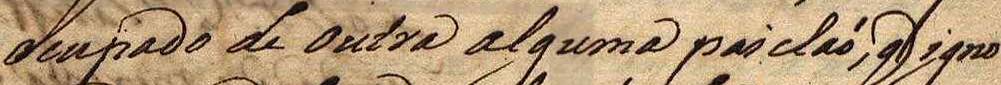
ocupado de outra alguma paichaõ, q̄ igno
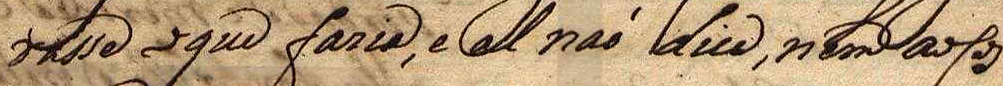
rasse o que fazia, e al naõ dice, nem ao Cos
